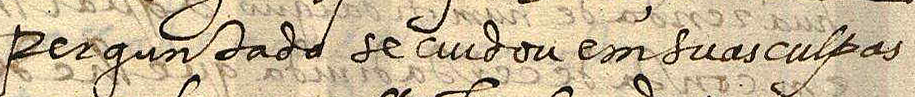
perguntado se cuidou em suas culpas
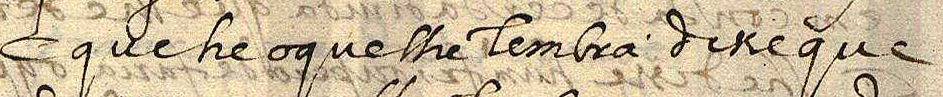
E que he o que lhe lembra disse que
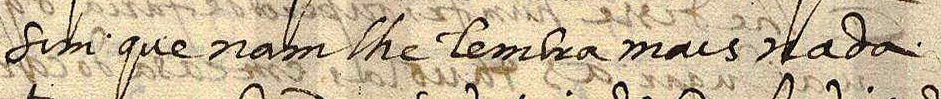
sim que nam lhe lembra mais nada
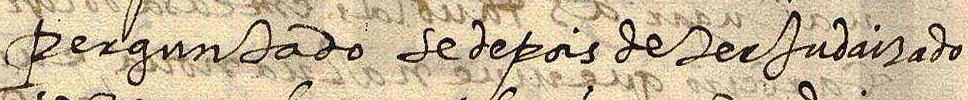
Perguntado se depois de ter Judaizado
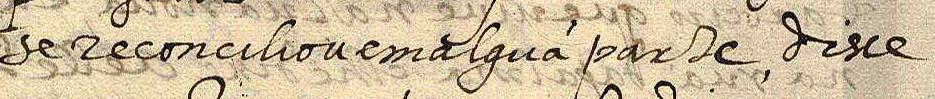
se reconciliou em alguā parte disse
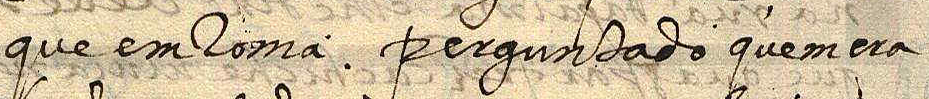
que em Roma perguntado quem era
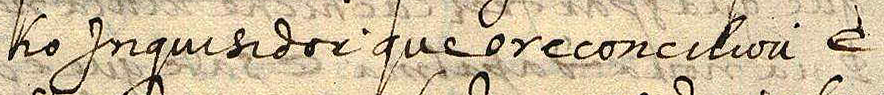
ho Jnquisidor que o reconciliou E
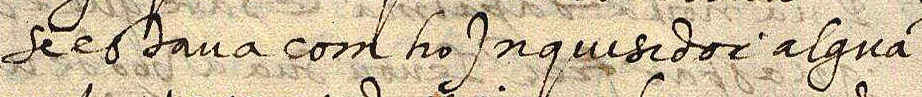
se estaua com ho Jnquisidor alguā
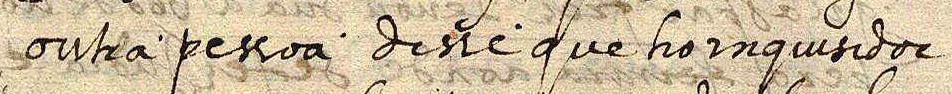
outra pessoa disse que ho inquisidor
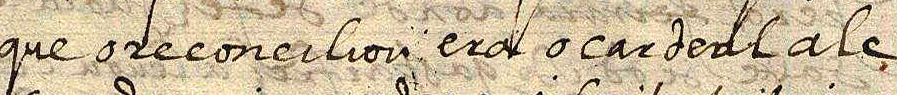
que o reconciliou era o cardeal ale
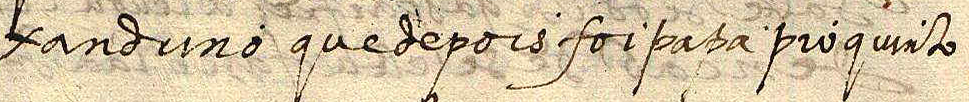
xandrino que depois foi papa pio quinto
